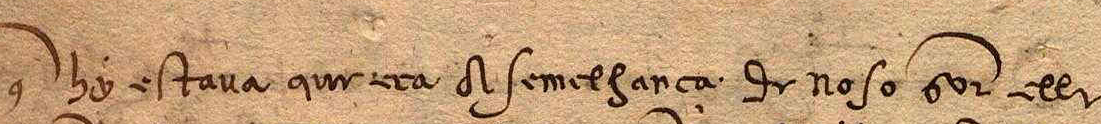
q̅ hy estaua que era A semelhança de noso s̄or elle
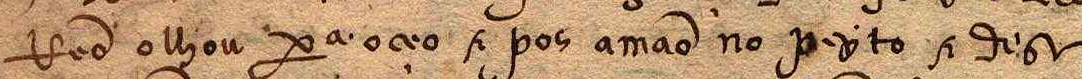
Rēo olhou ꝑa o ceo e pos a mão no peyto e dise
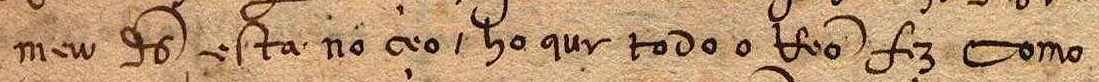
meu ds̄ esta no ceo / ho que todo o Reō fez Como
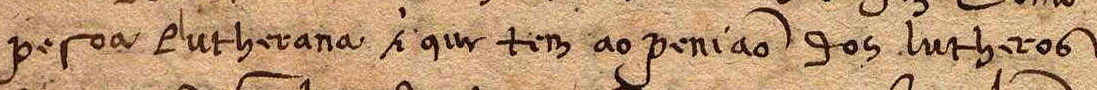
pesoa Lutherana e que tem a openião dos lutheros
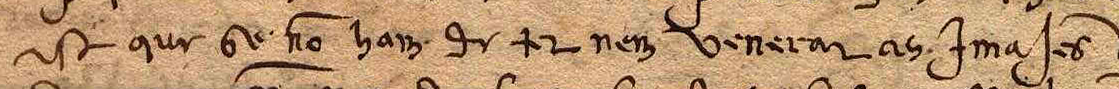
.s. que se n̄o ham de ter nem venerar as JmaJēs
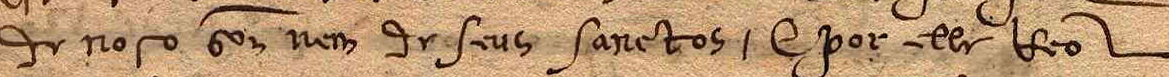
de noso s̄or nem de Seus Sanctos / E por elle Reō
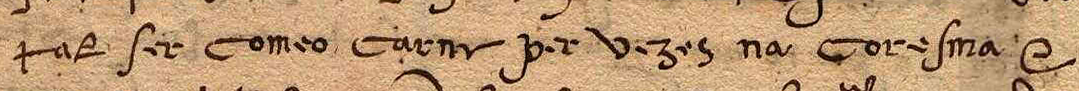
taL ser Comeo Carne per vezes na Coresma e
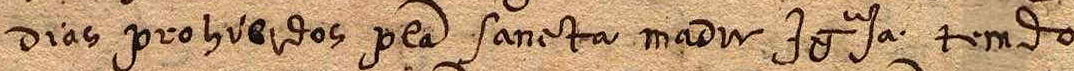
dias prohibjdos pl̄a Sancta madre JḡJa temdo
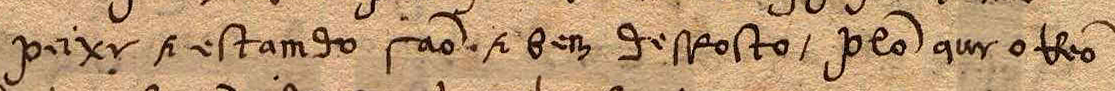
peixe e estamdo saõ e bem desposto / plō que o Reō
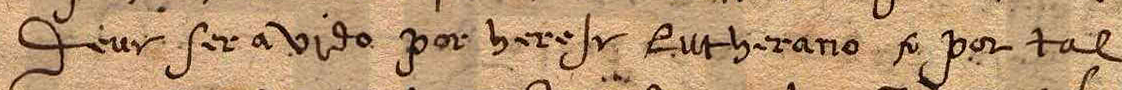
deue ser avjdo por hereJe lutherano e por tal
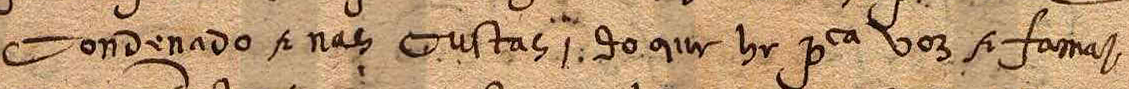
Condenado e nas custas / do que he pca voz e fama /
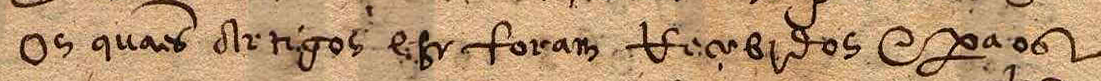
Os quāes Artigos lhe foram Recebjdos e ꝑa os
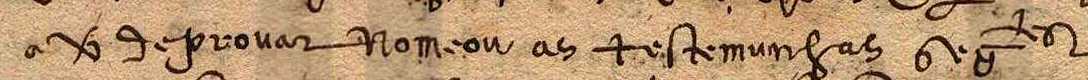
aꝟ de prouar nomeou as testemunhas segtes
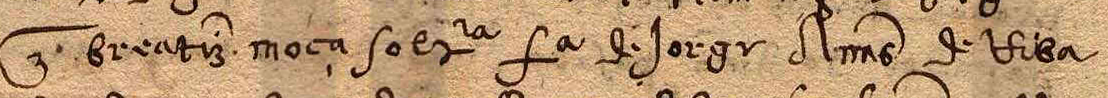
item breatīz moça Soltra fa de Jorge Ann̄es de Riba
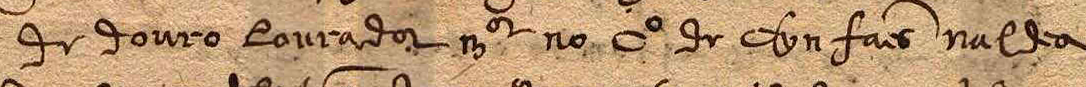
de douro Laurador mor no Co de Cynfaẽs naldea
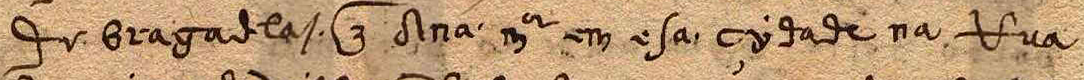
de bragadela /. item Ana mor em esa cydade na Rua
